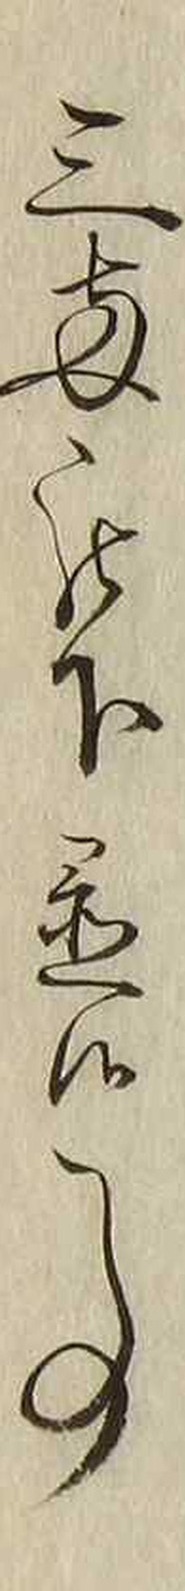三両被下置候事
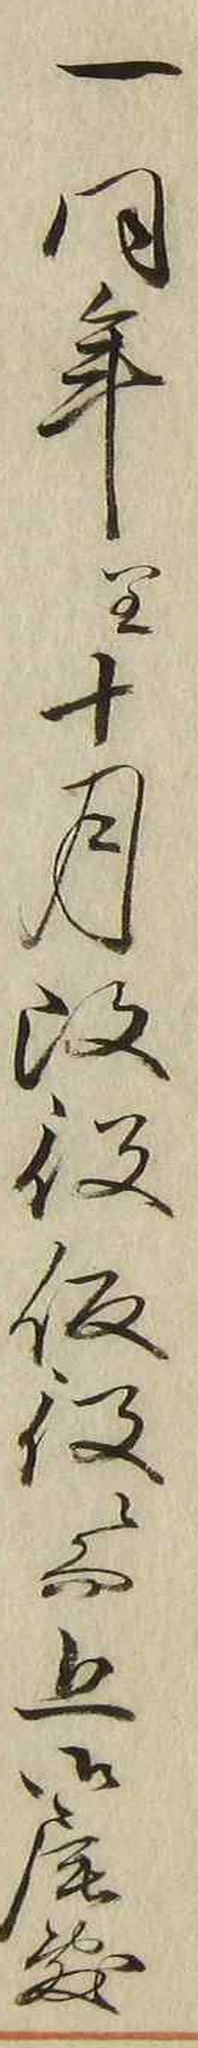一同年閏十月改役仮役ニ而上御屋敷
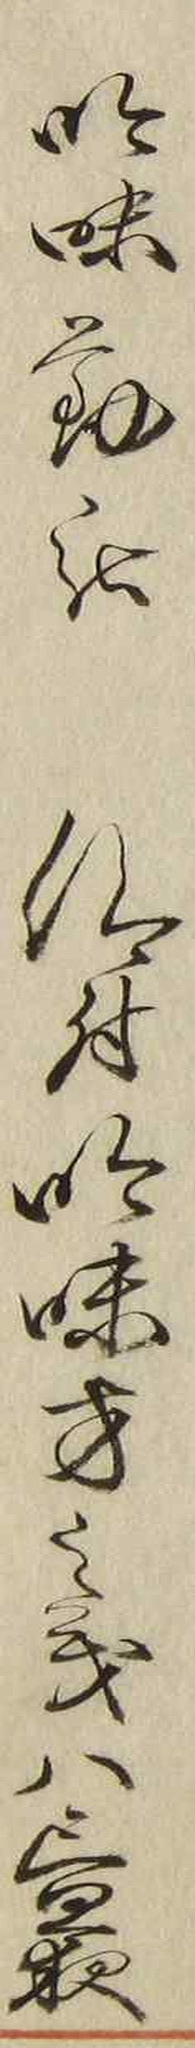吟味勤被仰付吟味方之義ハ昼夜

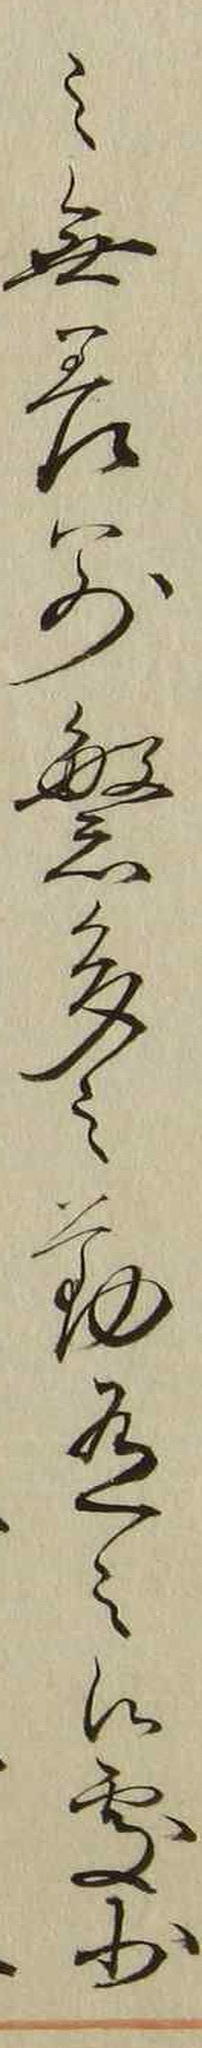之無差別繁多之勤有之候処少
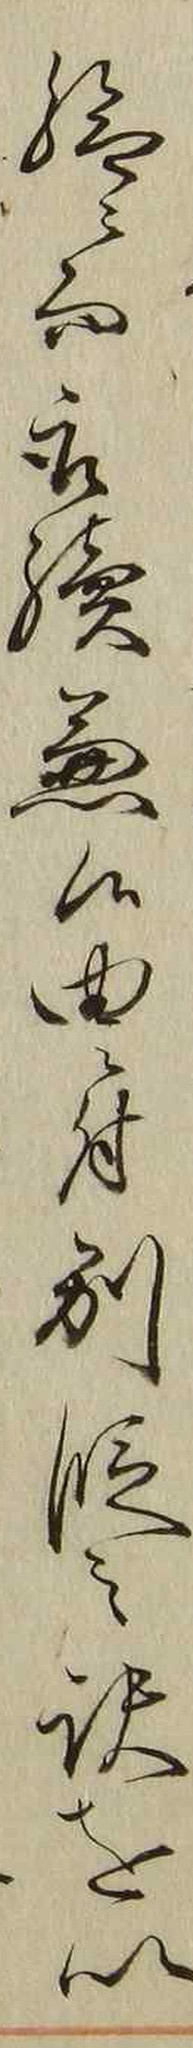給ニ而取続兼候由ニ付別段之訳を以
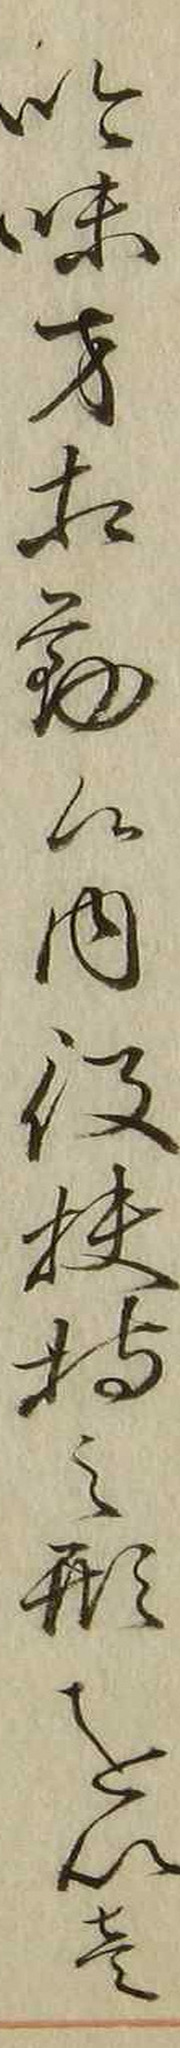吟味方相勤候内役扶持之形を以壱
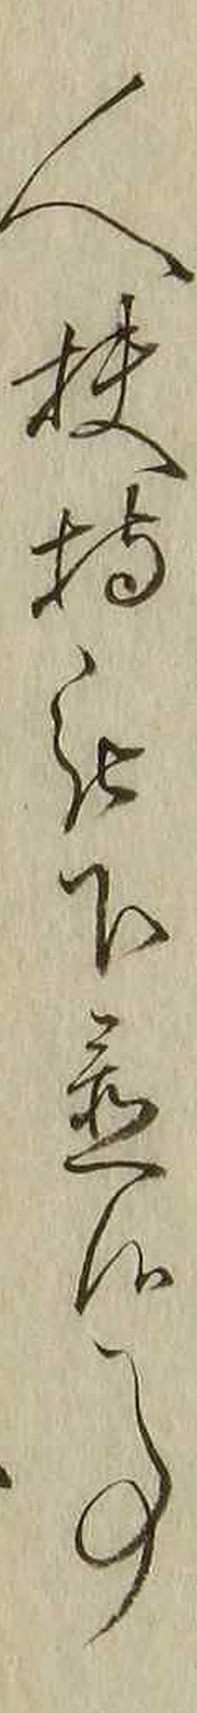人扶持被下置候事
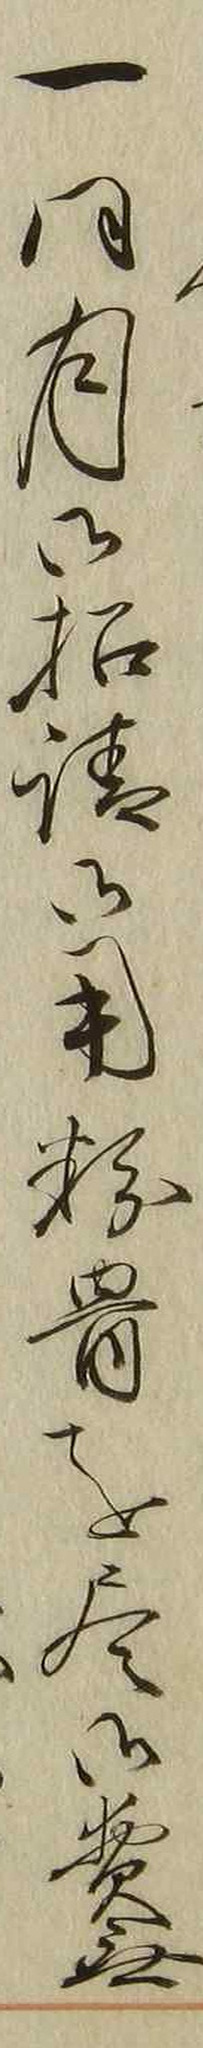一同月御招請御用粉骨を尽御費無
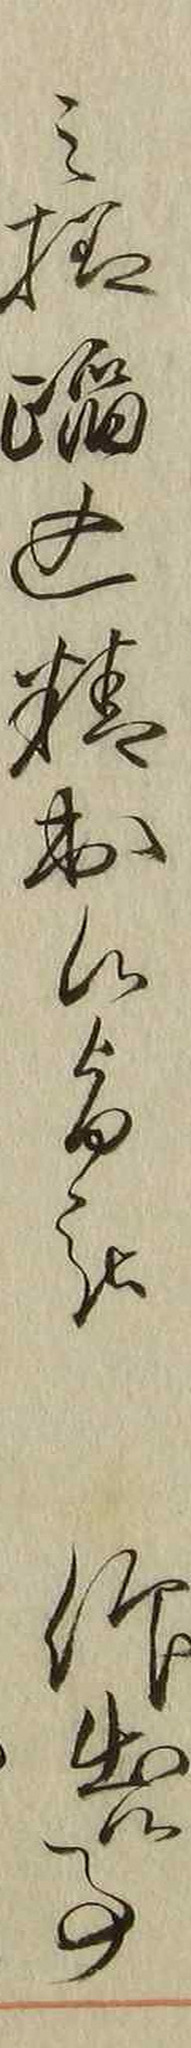之様踏込精出候旨被仰出候事
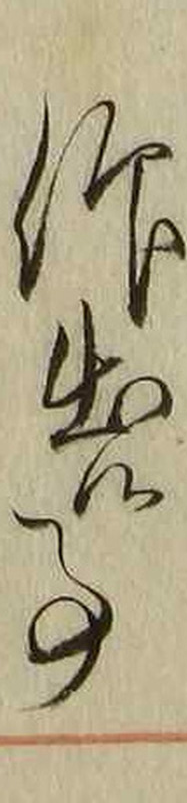仰付候事
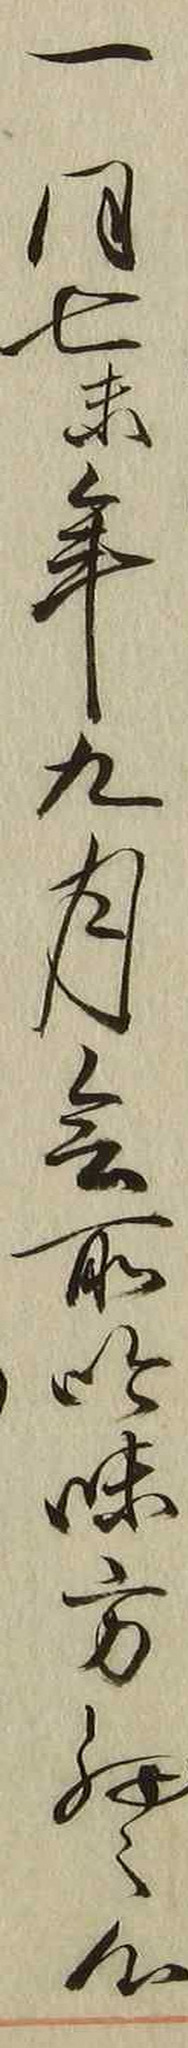一同七未年九月会所吟味方細々心
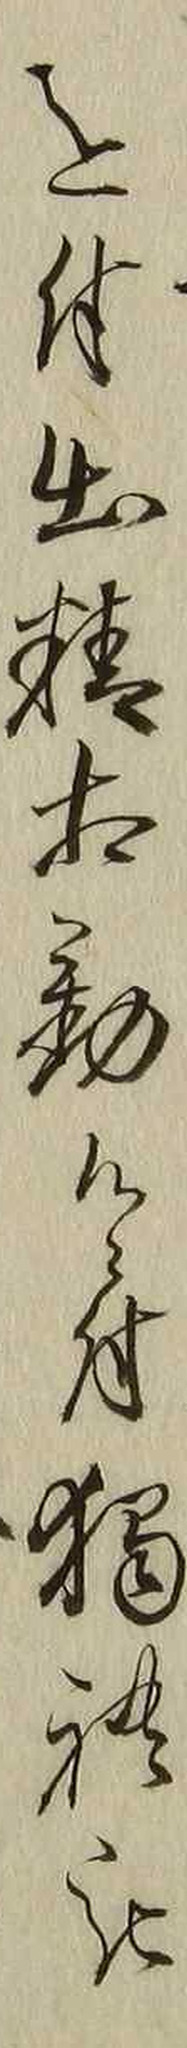を付出精相勤候ニ付独礼被
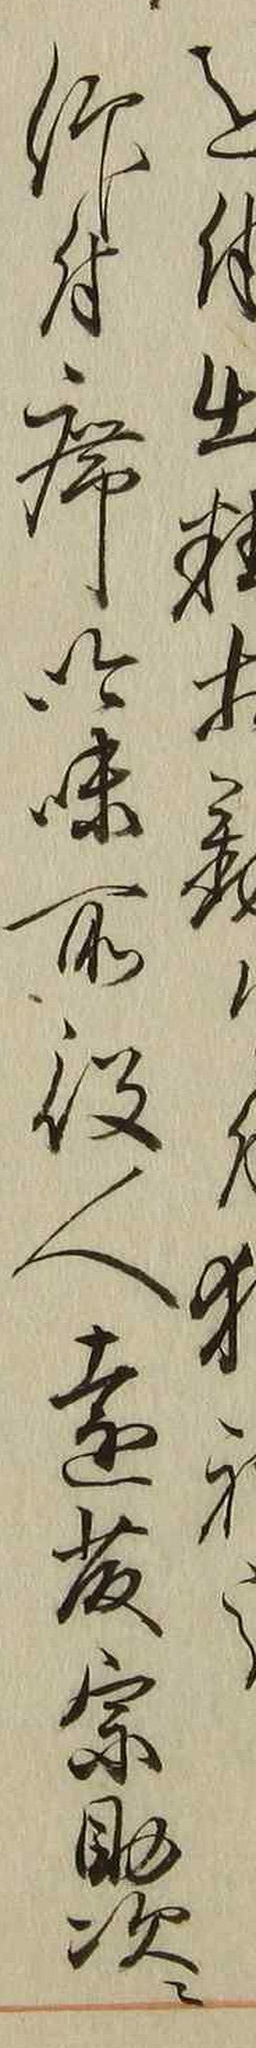仰付席吟味所役人遠藤宗助次ニ
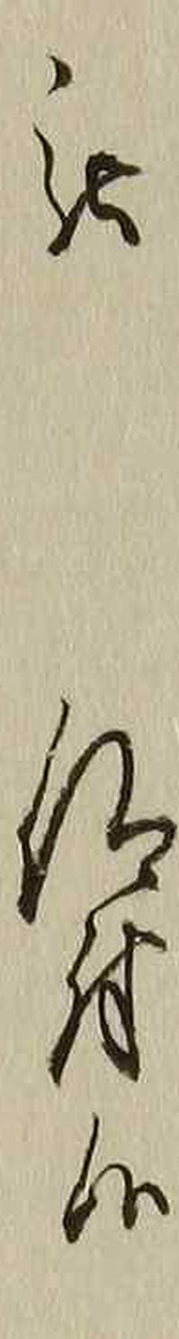被仰付候
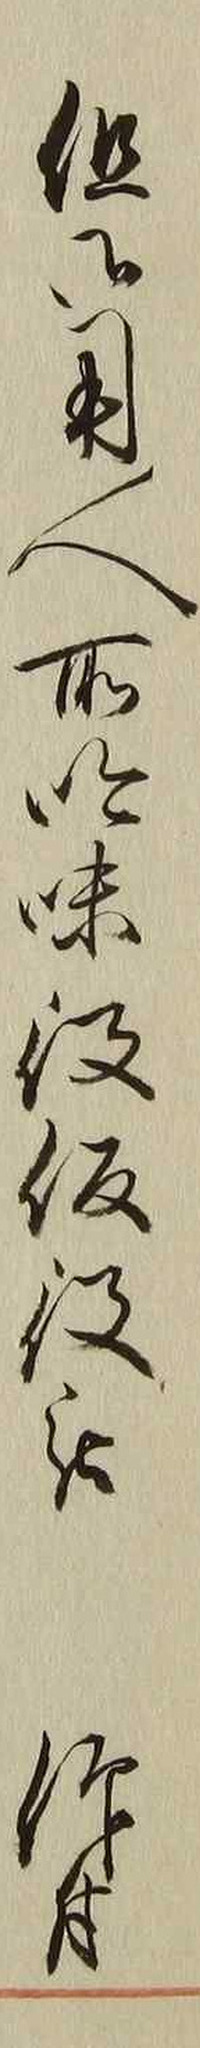但御用人所吟味役仮役被仰付
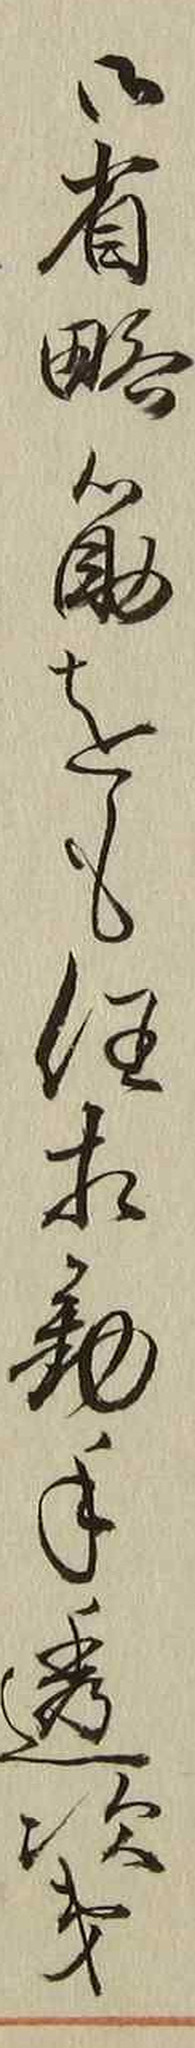御省略筋をも任相勤手透次第
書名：諸士系譜　巻之57　ほ之部4
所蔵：会津若松市立会津図書館
